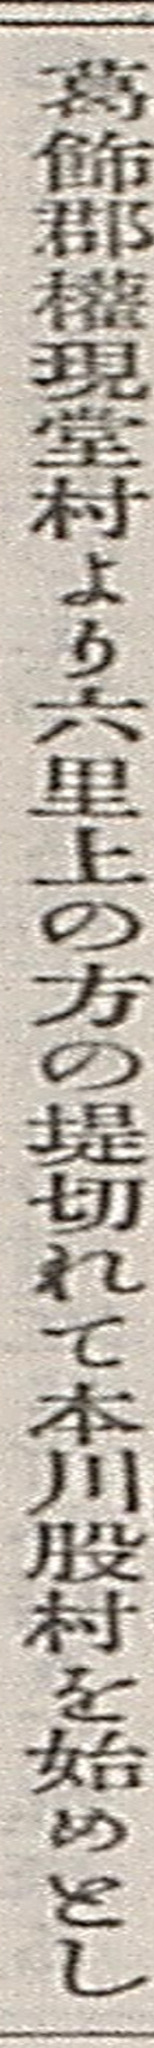葛飾郡権現同村より六里上の方の堤切れて本川股村を始めとし
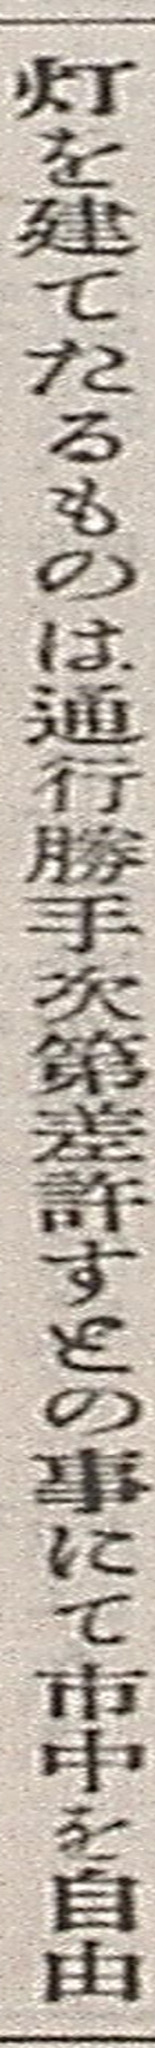灯を建てたるものは通行勝手次第差許すとの事にて市中を自由
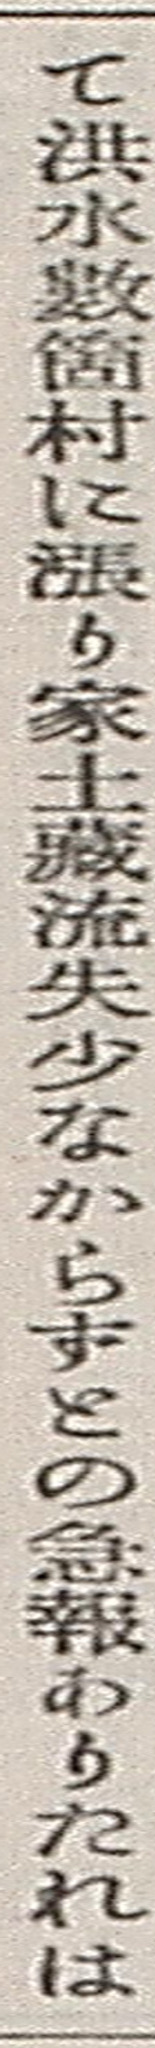て洪水数箇村に漲り家土蔵流失少なからずとの急報ありたれは
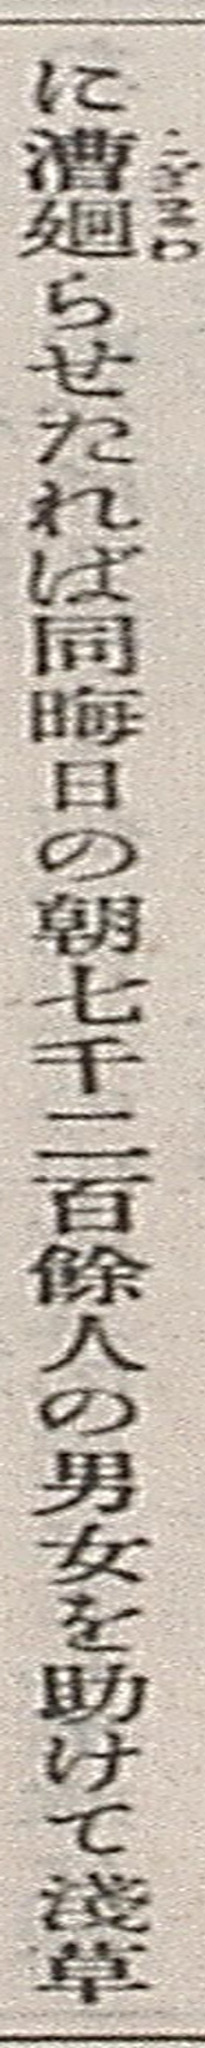に漕廻らせたれば同晦日の朝七千二百余人の男女を助けて浅草
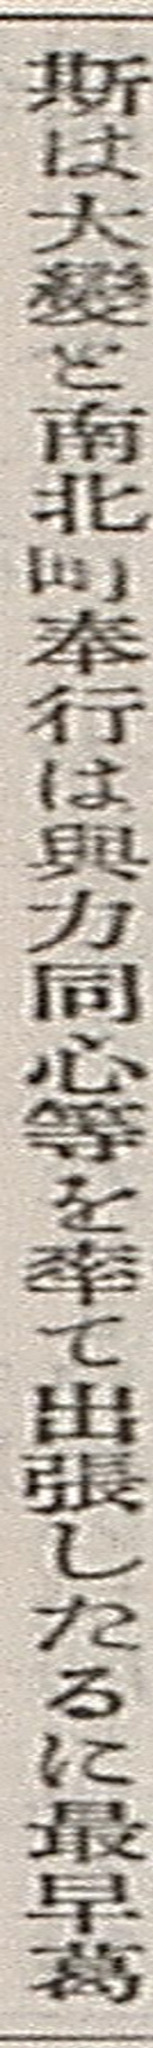斯は大変と南北町奉行は与力同心等を率て出張したるに最早葛
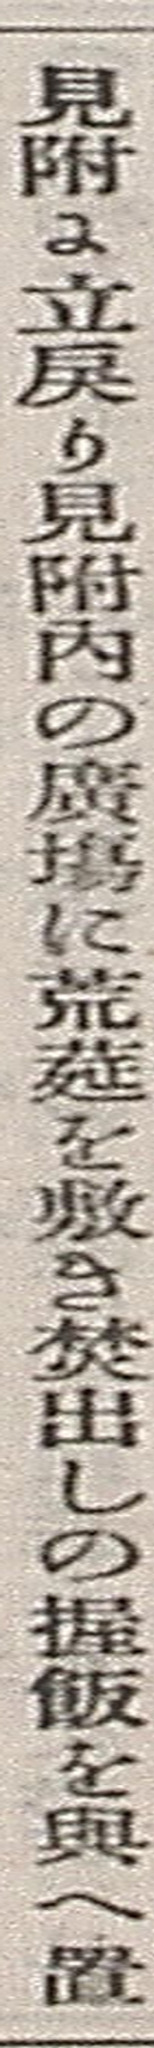見附に立戻り見附内の広場に荒筵を敷き焚出しの握飯を与へ置
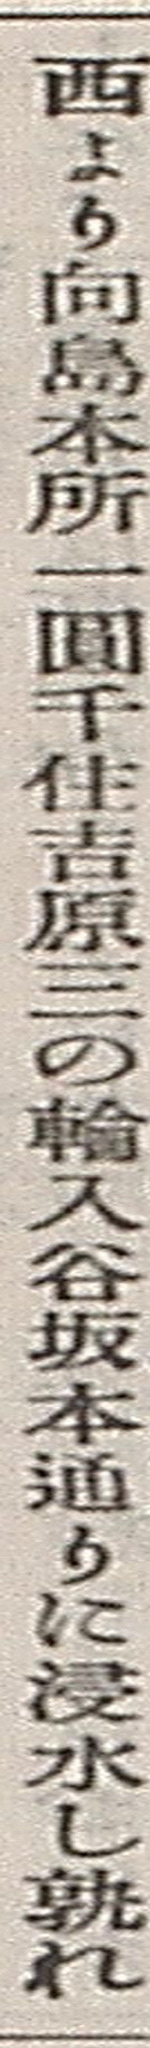西より向島本所一円千住吉原三の輪入谷坂本通りに浸水し孰れ
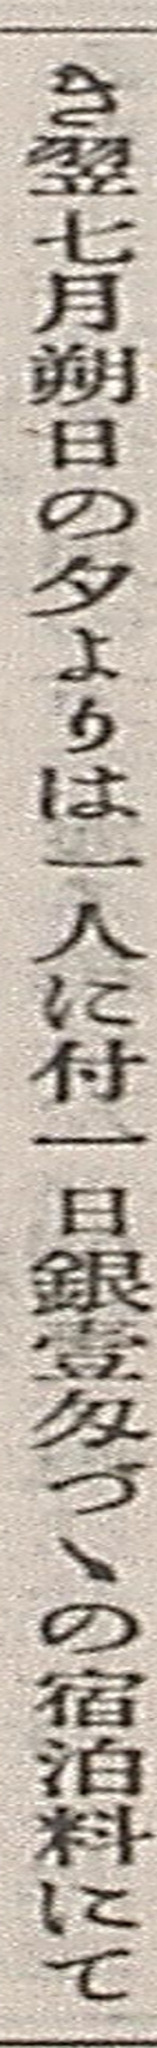き翌七月朔日の夕よりは一人に付一日銀壱匁づゝの宿泊料にて
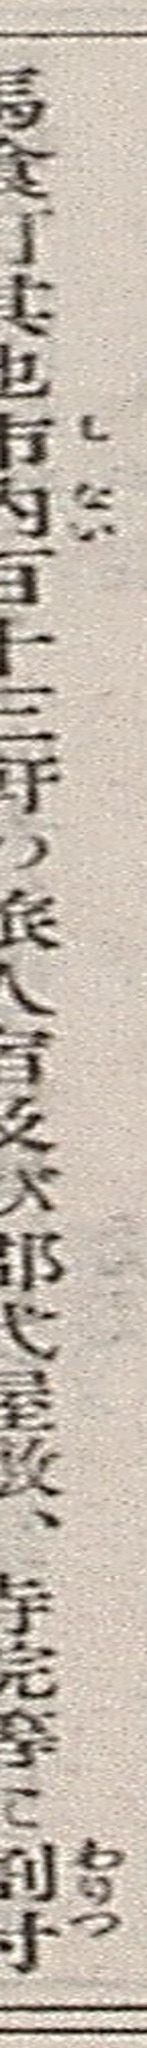馬喰町其他市内百十三軒の旅人宿及び郡代屋敷、寺院等に割付
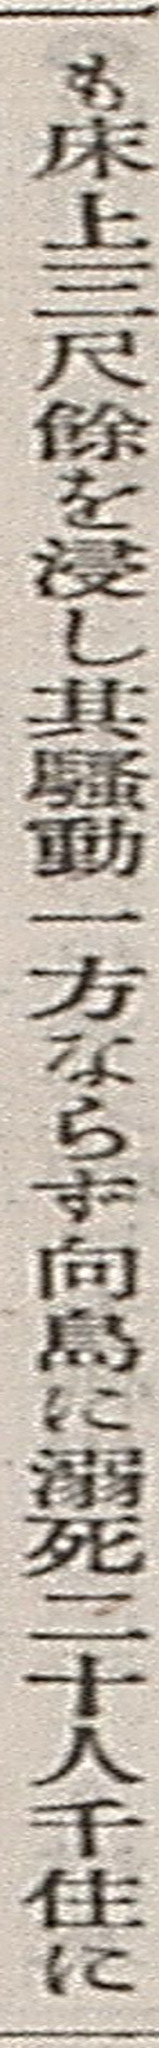も床上三尺余を浸し其騒動一方ならず向島の溺死二十人千住に
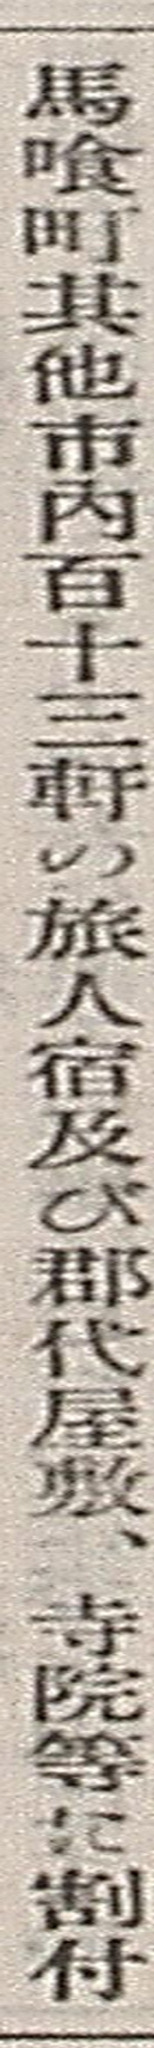馬喰町其他市内百十三軒の旅人宿及び郡代屋敷、寺院等に割付
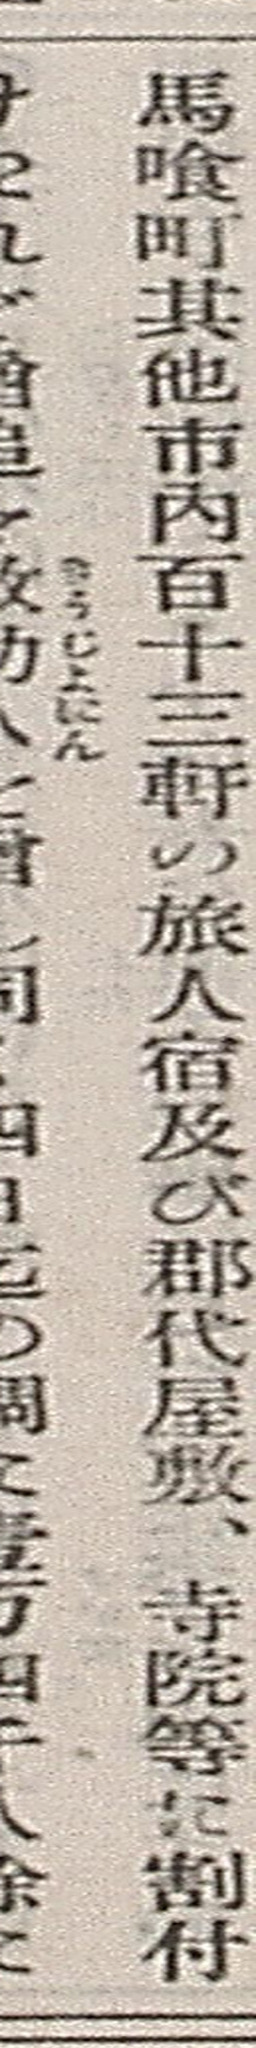けたれど猶追々救助人を増し同く四日迄の調に壱万四千人余に
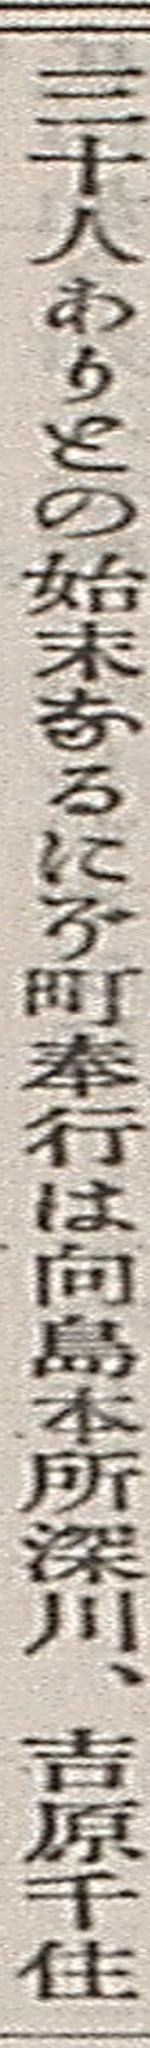三十人ありとの始末なるにぞ町奉行は向島本所深川、吉原千住
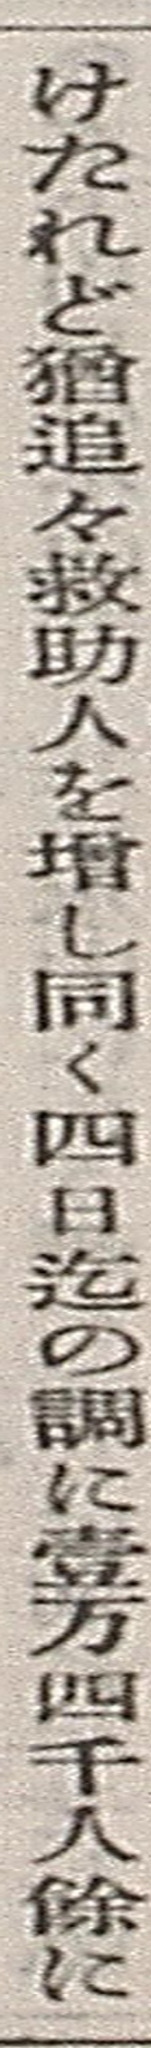けたれど猶追々救助人を増し同く四日迄の調に壱万四千人余に
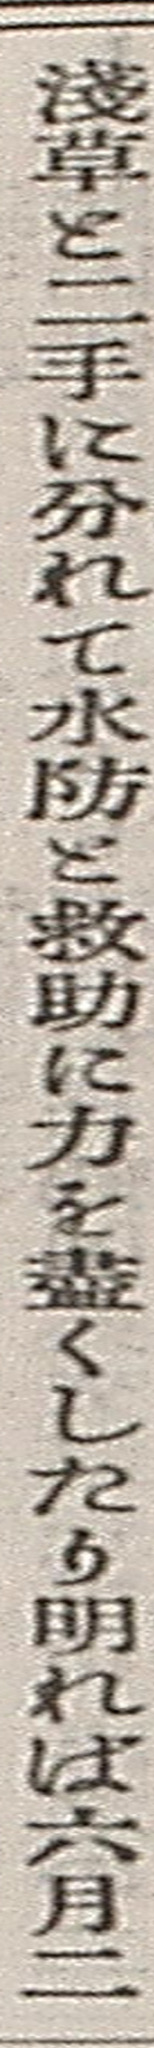浅草と二手に分れて水防と救助に力を尽くしたり明れば六月二
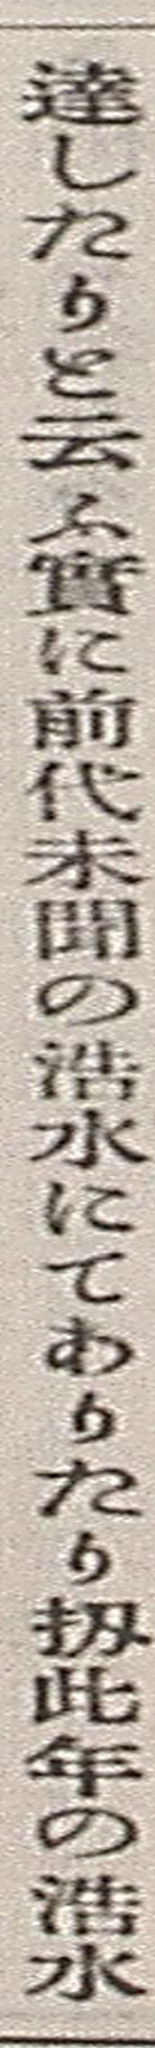達したりと云ふ実に前代未聞の浩水にてありたり扨此年の浩水
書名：風俗畫報臨時増刊第百二十四號　洪水地震被害録（上）
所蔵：東京大学地震研究所図書室 Earthquake Research Institute Library, The University of Tokyo, JAPAN
